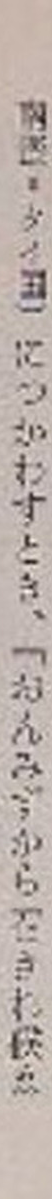南蛮＝タイ国)につかわすとき、「おんみずから召され候ゑ
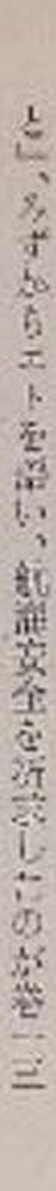と」、みずからエトを謡い、航海安全を祈求したのが巻一三
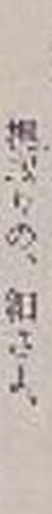楫取りの、細さよ、
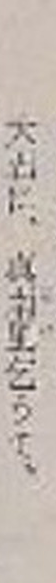大君に、真南風乞うて、
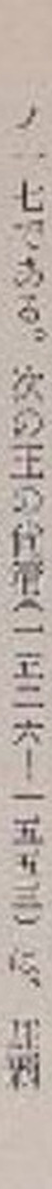ノ一七である。次の王の尚清(一五二六―一五五三)に、那覇
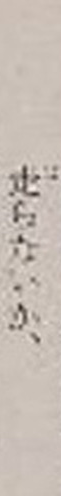走らないか、
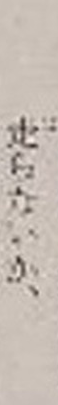走らないか、
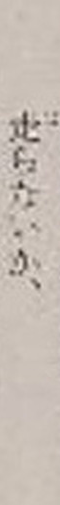走らないか、
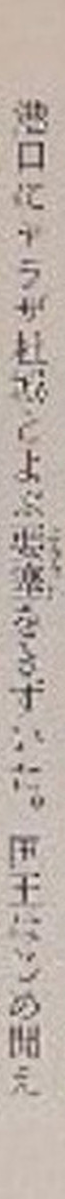港口にヤラザ杜城とよぶ要塞をきずいた。国王はじめ聞え
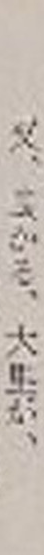又、よかる、大里が、
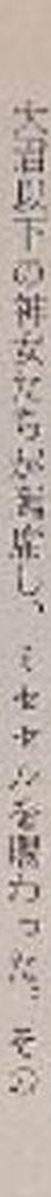大君以下の神女たちが臨席し、ミセセルを賜わった。その
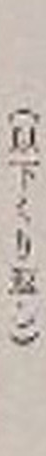(以下くり返し)
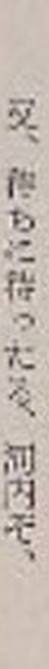又、待ちに待ったる、河内ぞ、
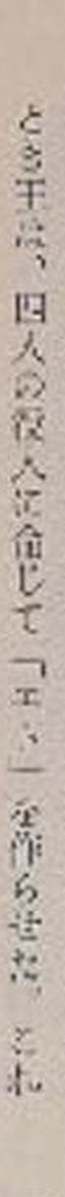とき王は、四人の役人に命じて「エト」を作らせた。これ
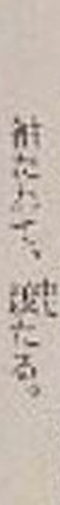袖たれて、渡たる。
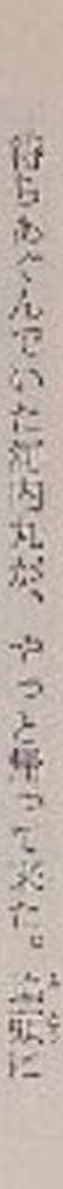待ちあぐんでいた河内丸が、やっと帰って来た。埠頭に
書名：沖縄口承文芸
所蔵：University of the Ryukyus Library
